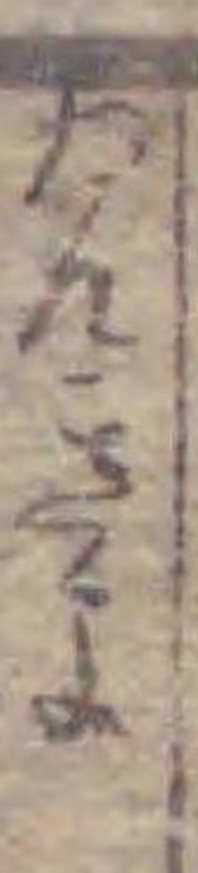ゐんきよ
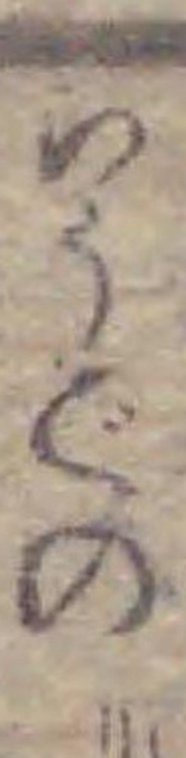らうごの
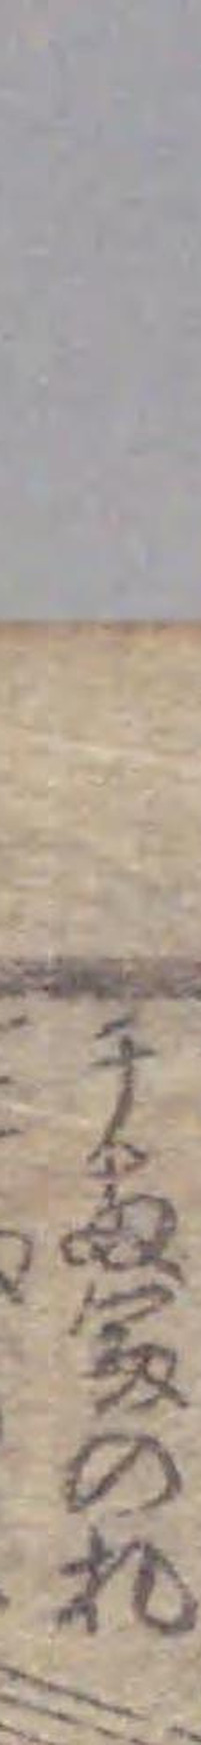千両富の札
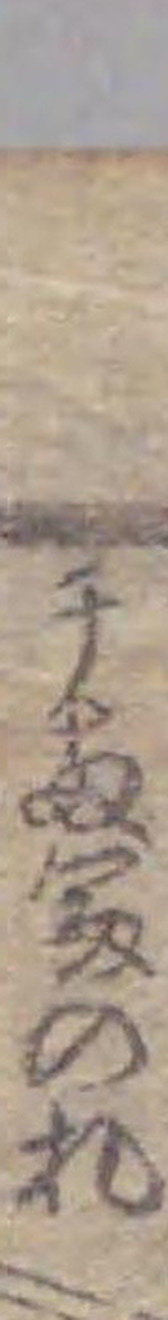千両富の札
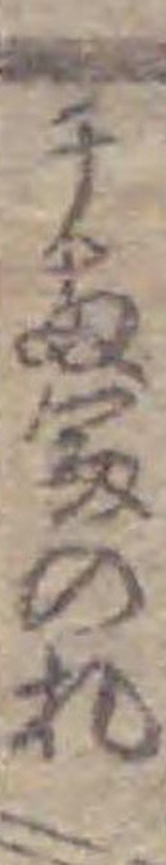千両富の札
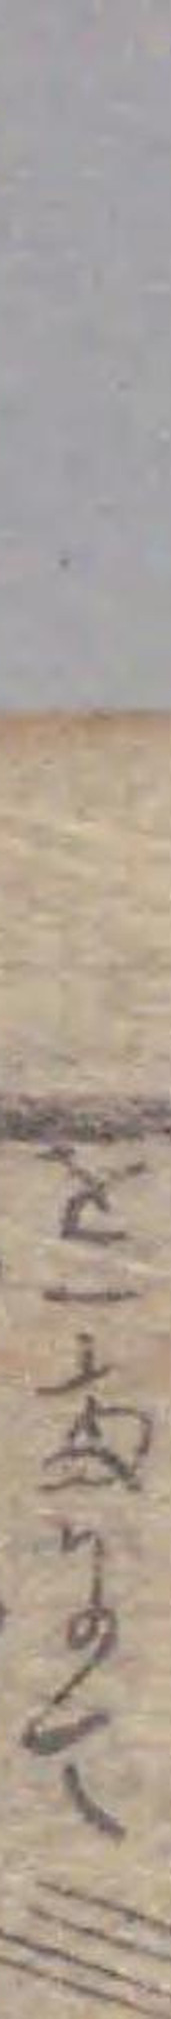を一両にて
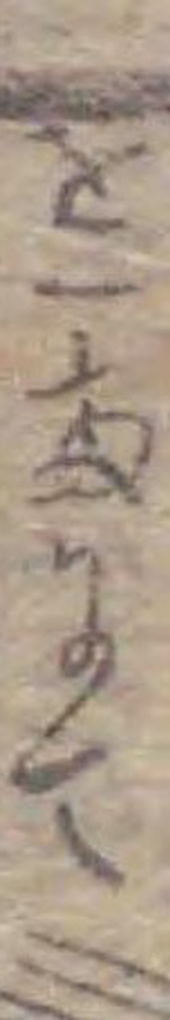を一両にて
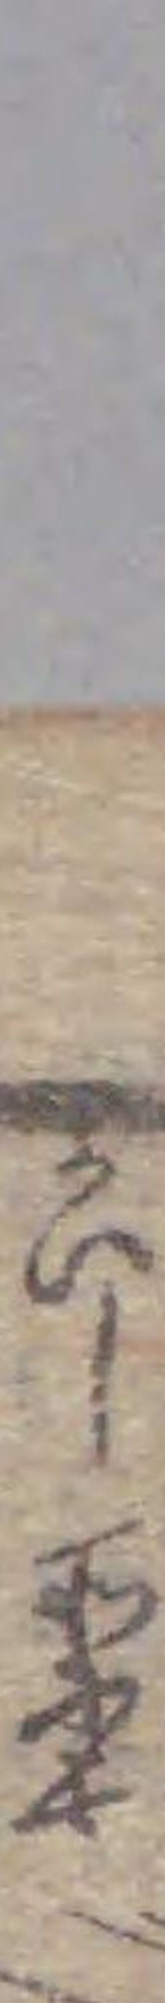かいし所に
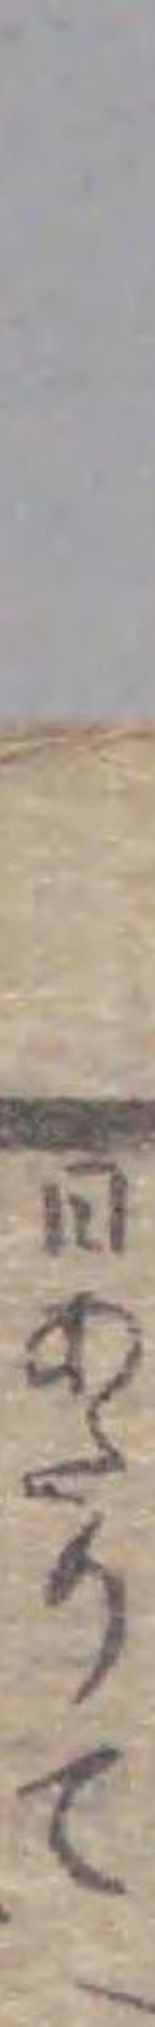日あたりて
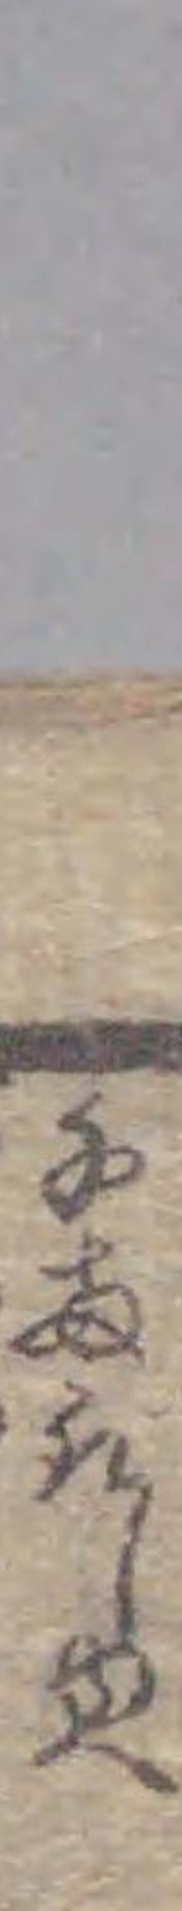千両取しゆへ
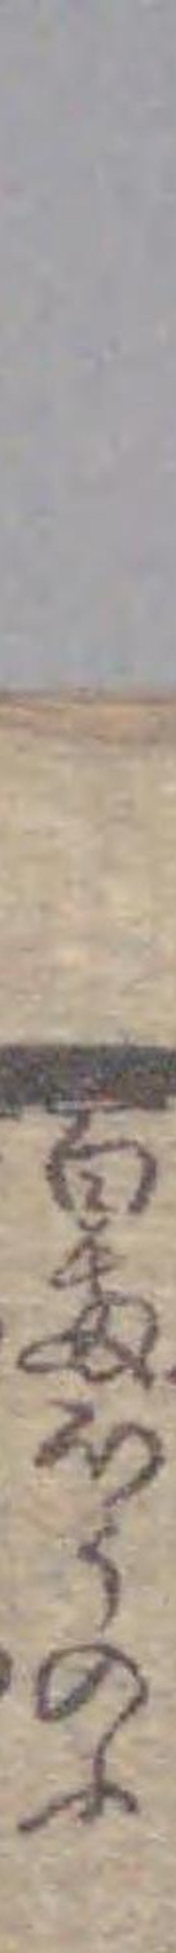百両ほうのふ
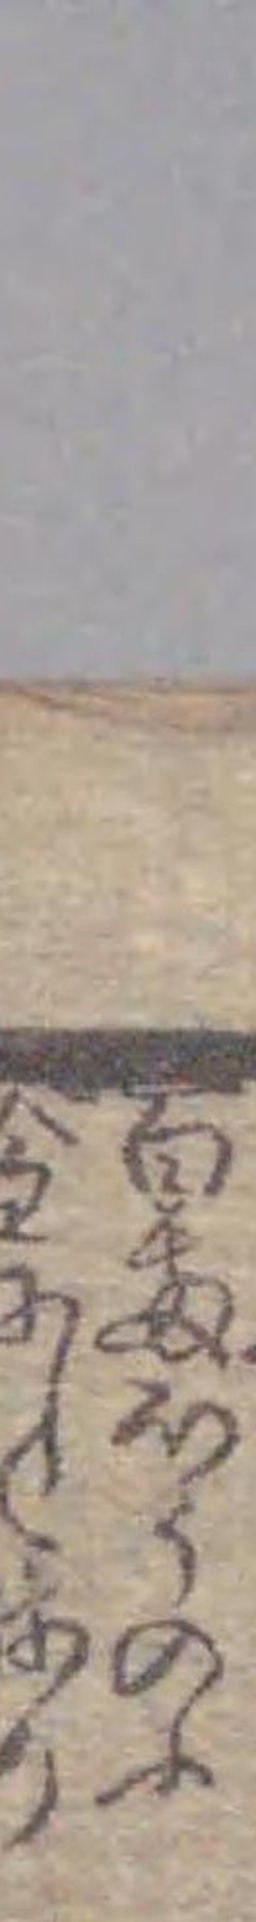金にして残り
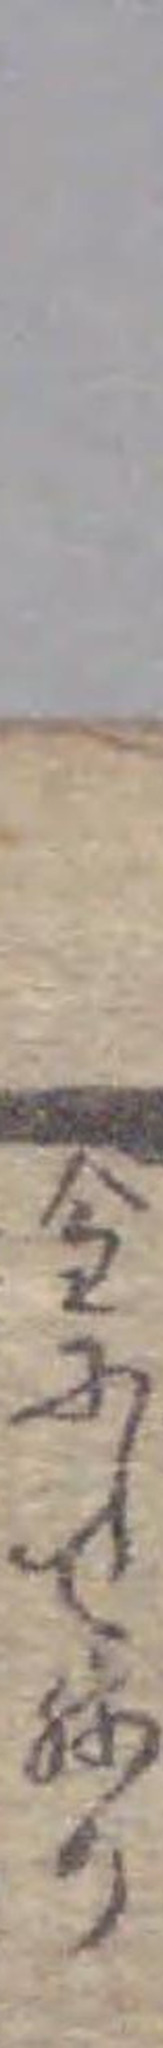金にして残り
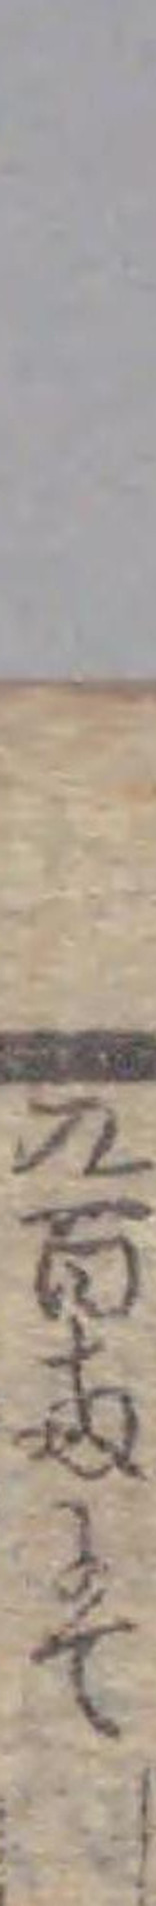九百両にて
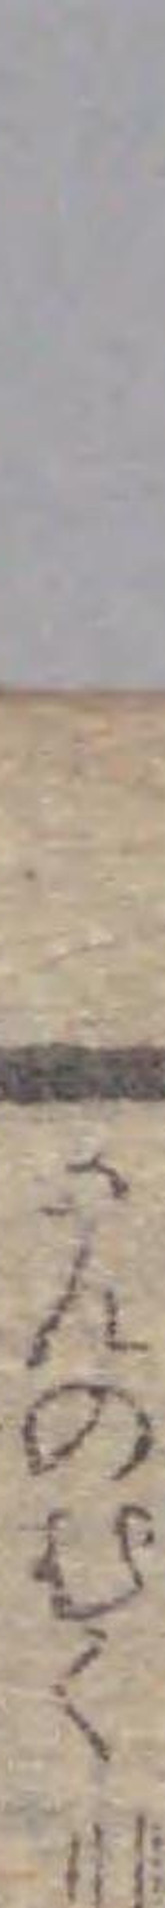きんのむく
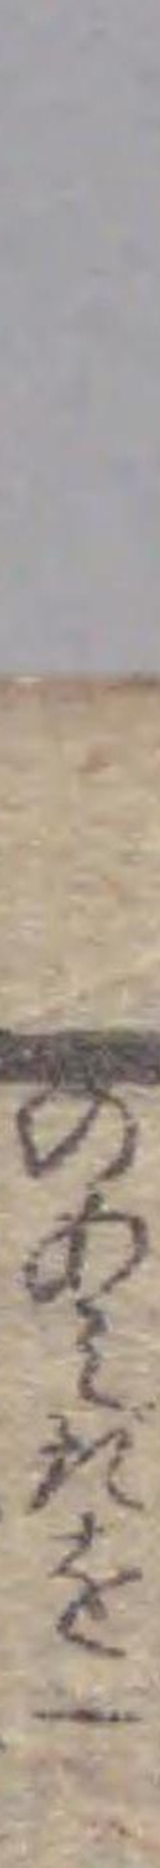のあみだを一
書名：紺屋百物語 : 3巻
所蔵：国立国会図書館 National Diet Library, JAPAN
